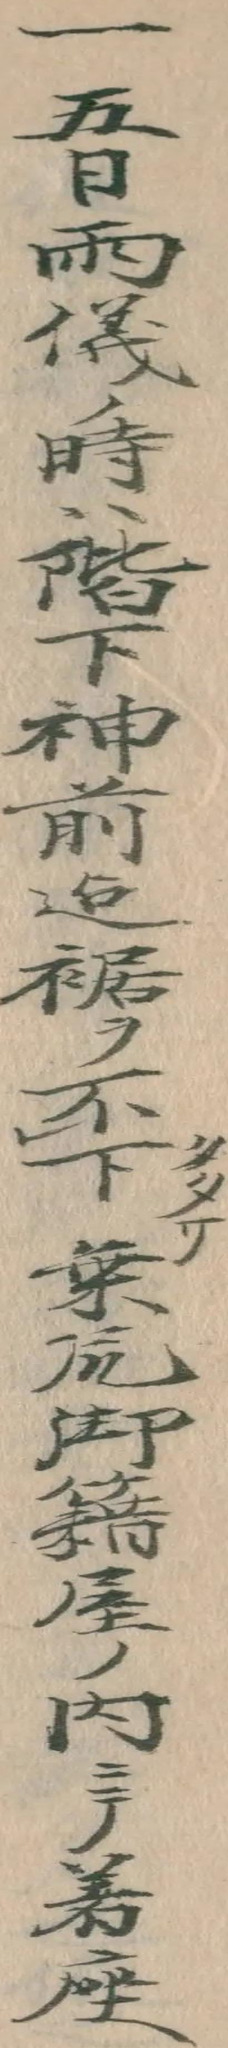一五日雨儀ノ時ハ階下神前迄裾ヲ不下乗尻御籍屋ノ内ニテ着座
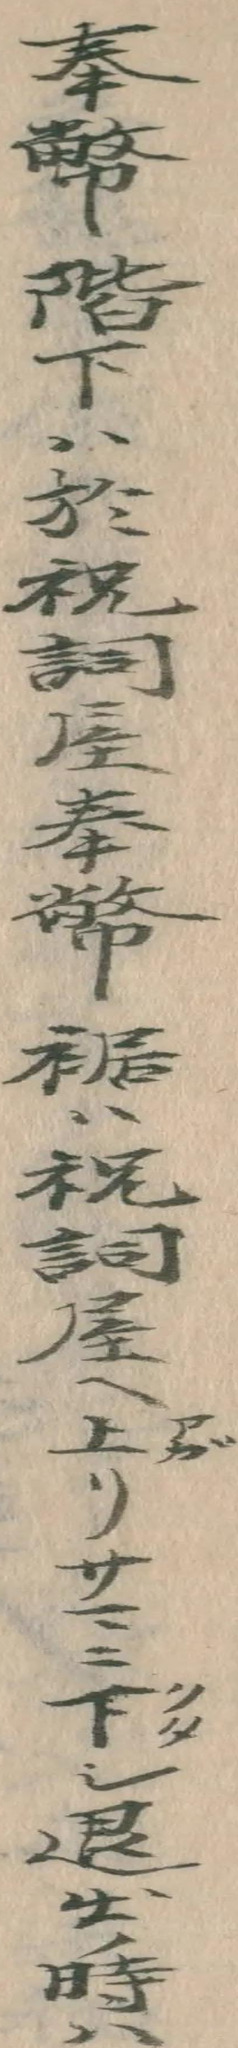奉幣階下ハ於祝詞屋奉幣裾ハ祝詞屋へ上リサマニ下シ退出ノ時ハ
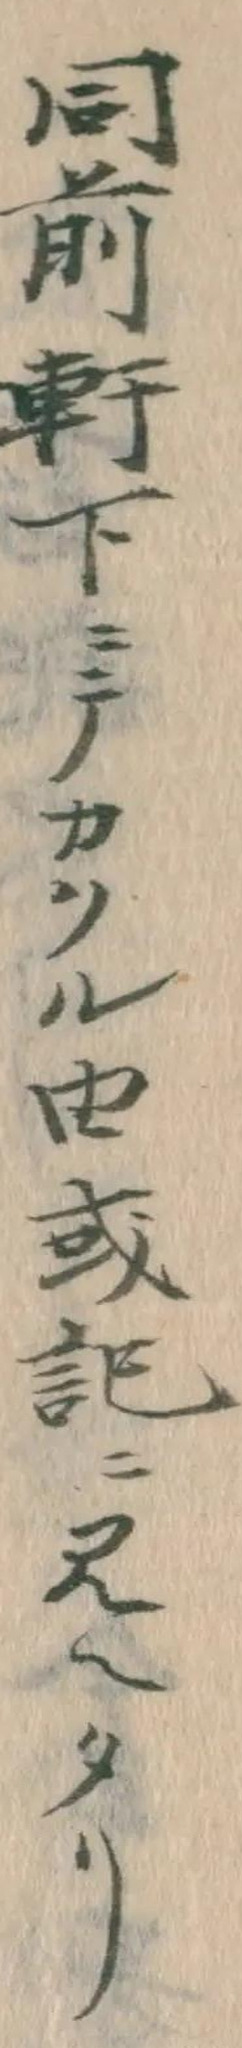同前軒下ニテカクル由或記ニ見へタリ
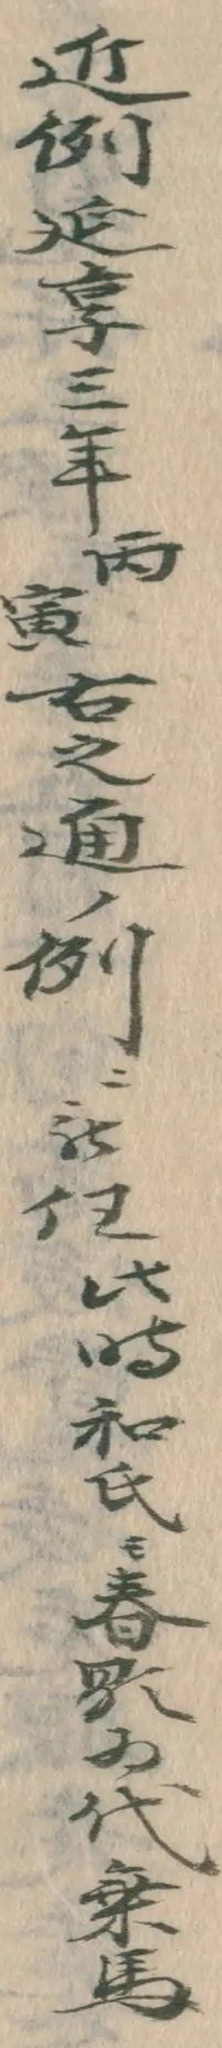近例延享三年丙寅右之通ノ例ニ被任此時和氏モ春顕為代乗馬
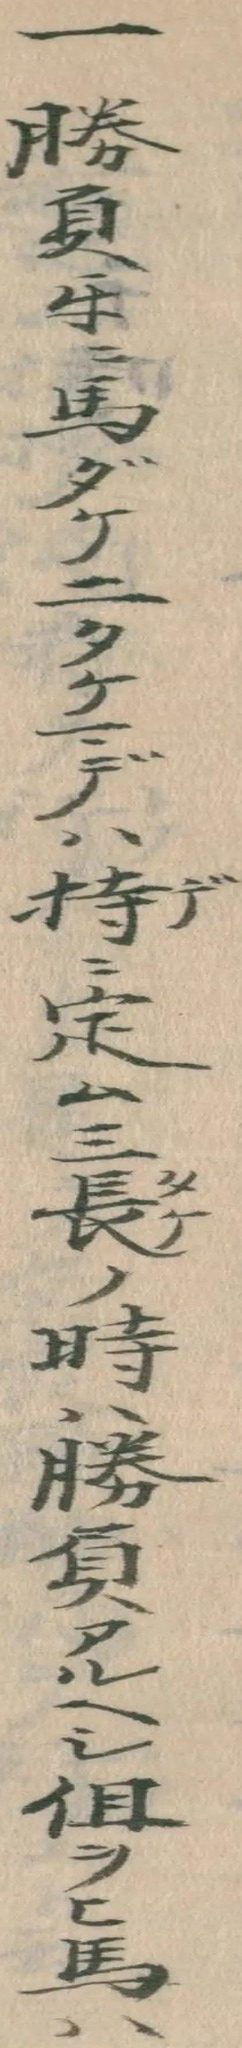一勝負互ニ馬ダケ二タケマデハ持ニ定ム三長ノ時ハ勝負アルヘシ但ヲヒ馬ハ
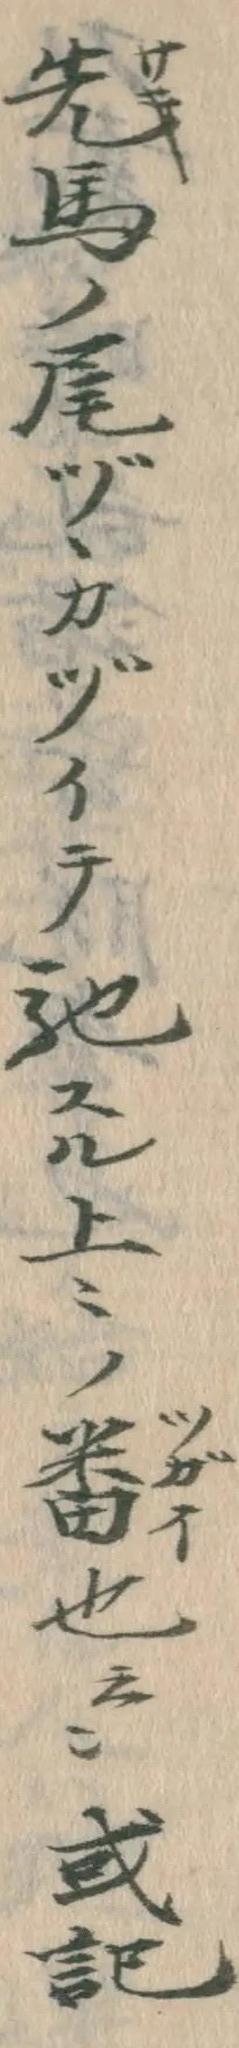先馬ノ尾ヅヽカヅイテ馳スル上々ノ番也云々或記
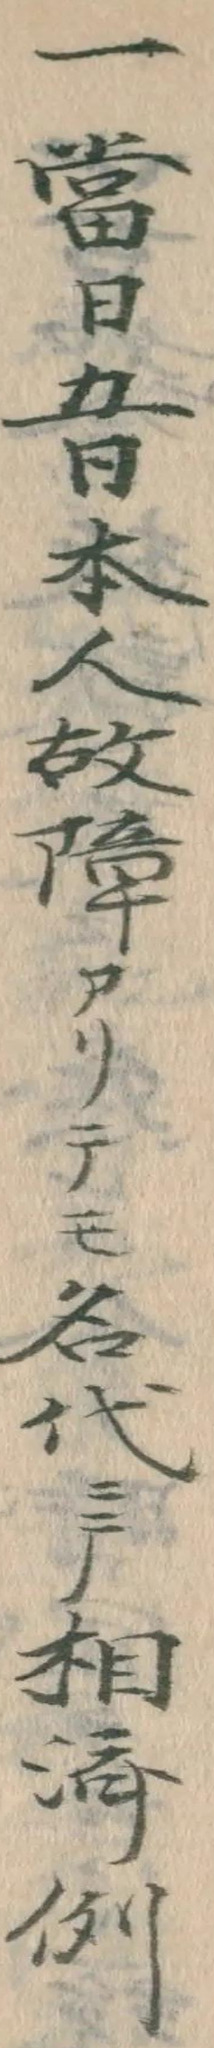一当日五日本人故障アリテモ名代ニテ相済例
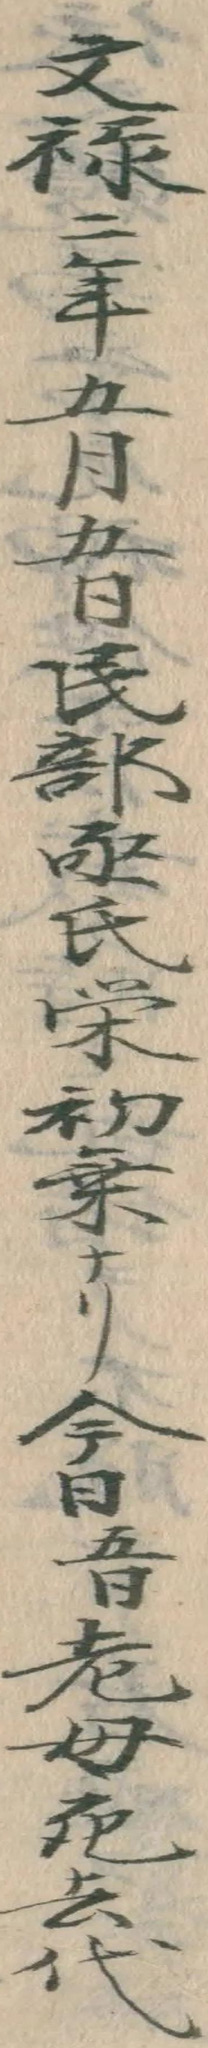文禄二年五月五日民部丞氏栄初乗ナリ今日五日老母死去代
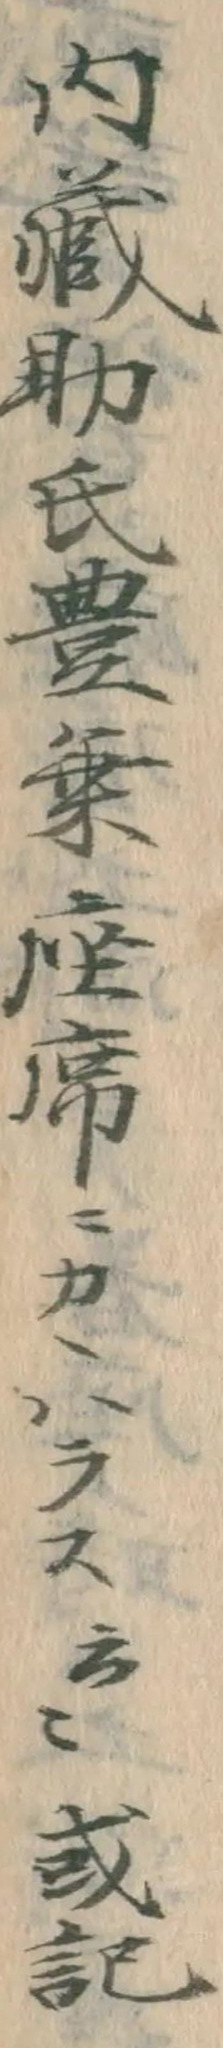内蔵助氏豊乗座席ニカヽハラス云々或記

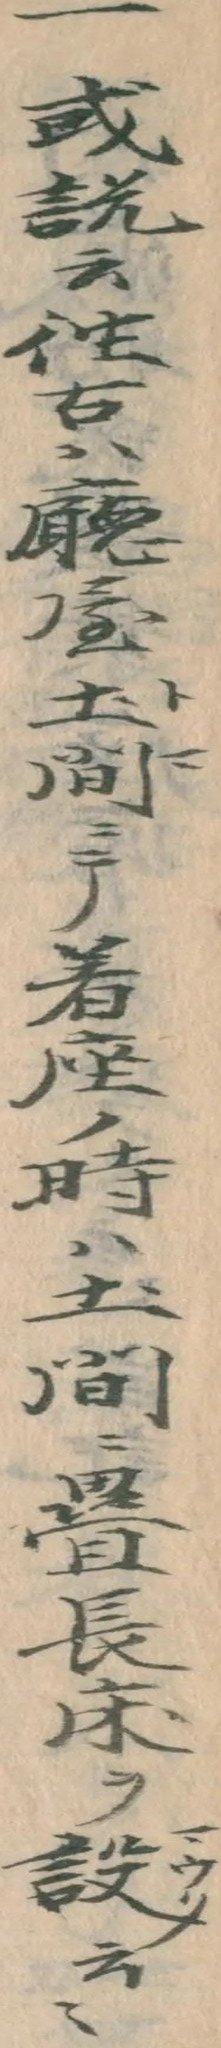一或説云往古ハ庁屋土間ニテ着座ノ時ハ土間ニ畳長床ヲ設云々
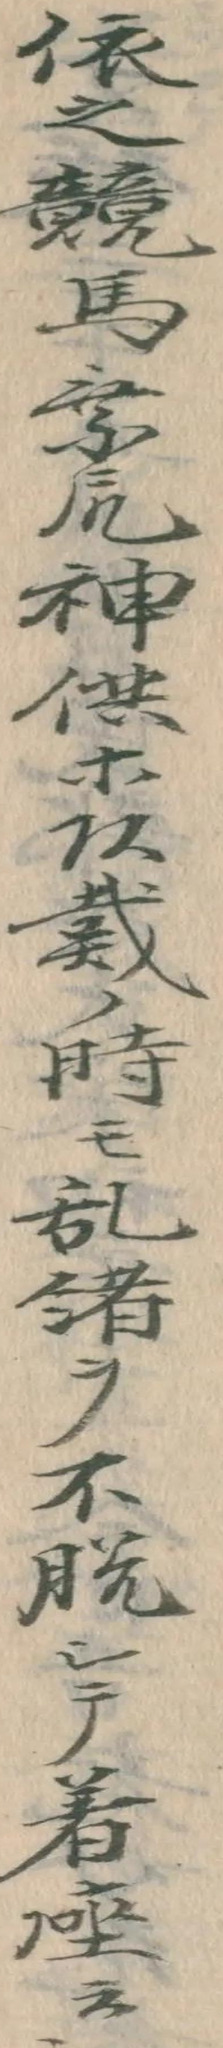依之競馬乗尻神供等頂戴ノ時モ乱緒ヲ不脱シテ着座云々
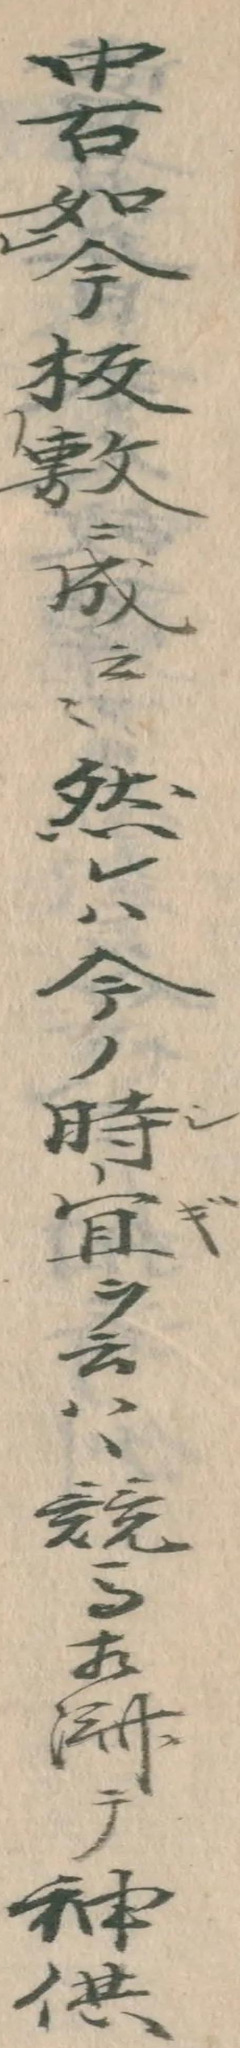中古如今板-敷ニ成云々然レハ今ノ時-宜ヲ云ハヽ競馬相済テ神供
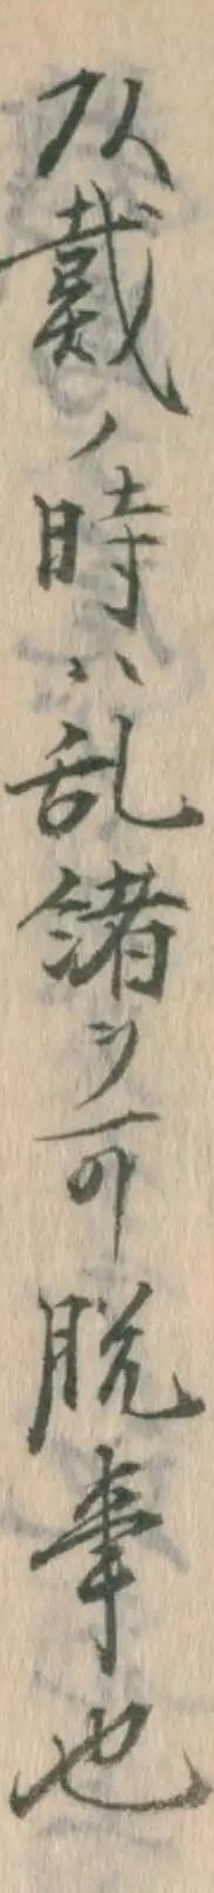頂戴ノ時ハ乱緒ヲ可脱事也
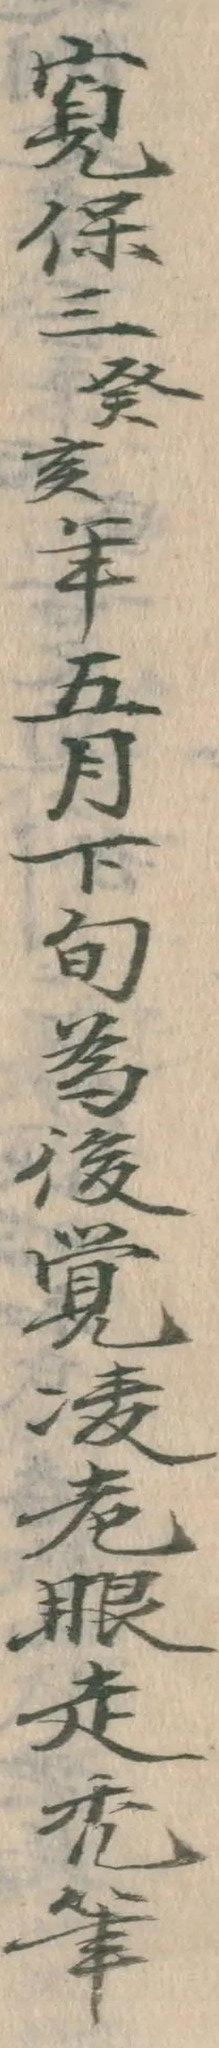寛保三癸亥年五月下旬為後覚凌老眼走秃筆
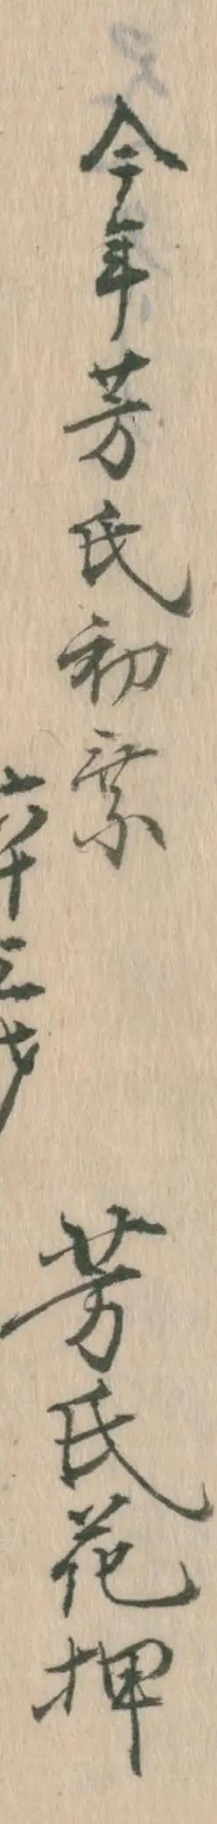今年芳氏初乗芳氏花押
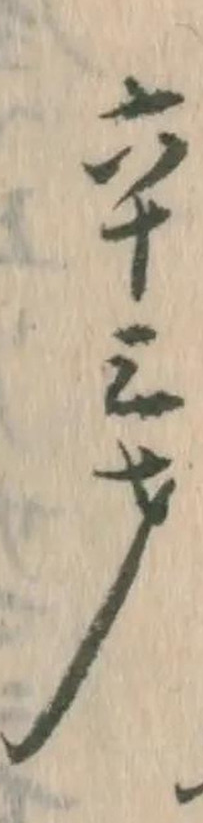六十三才
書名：賀茂社記録. 第11冊
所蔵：国立国会図書館 National Diet Library, JAPAN
